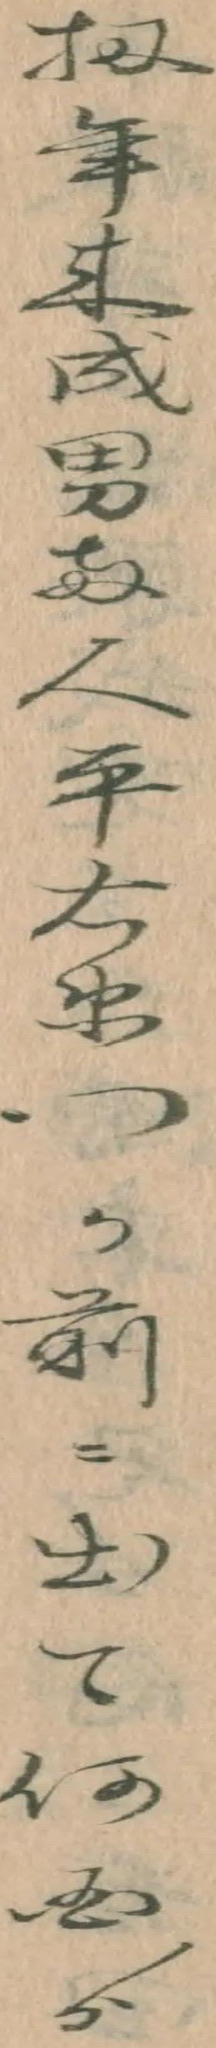扨年来成男両人平右衛門か前に出て何国ゟ
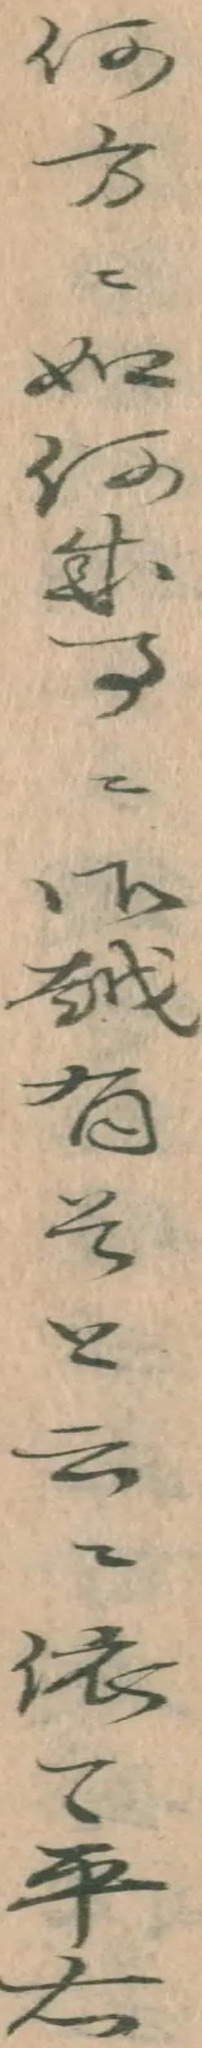何方に如何成事に御越有そと云に依て平右
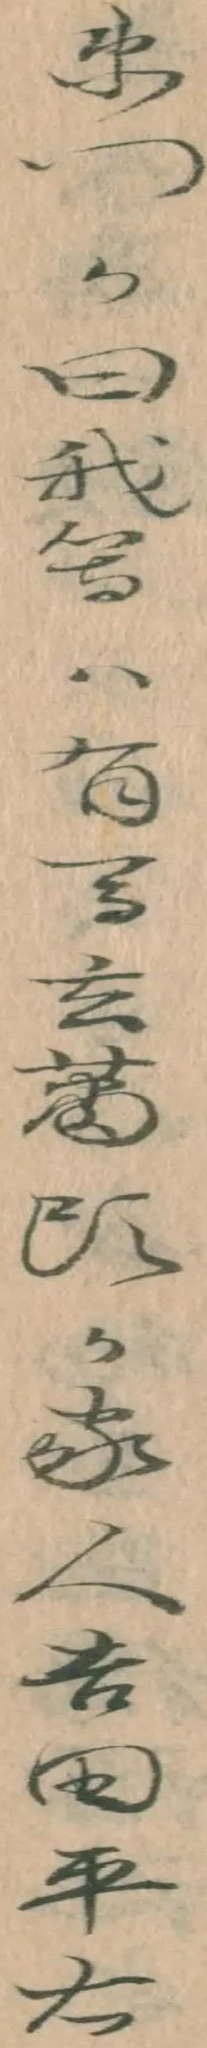衛門か曰我等は有馬玄蕃頭か家人吉田平右
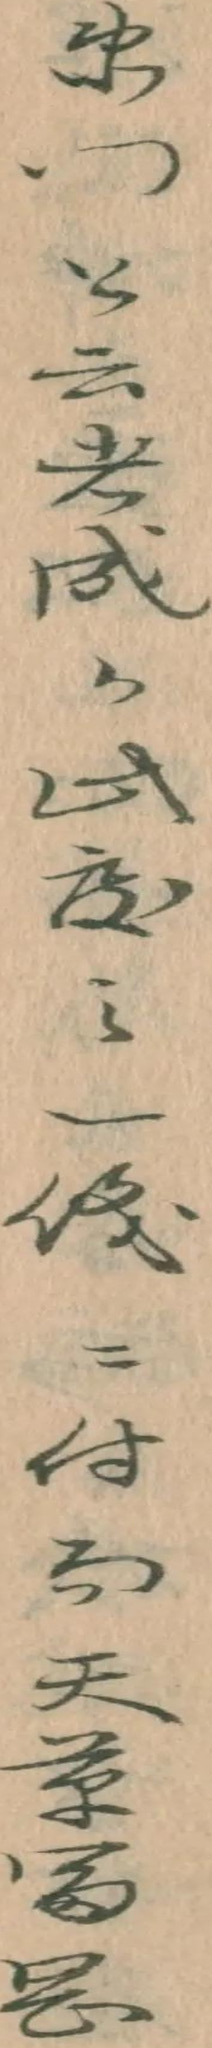衛門と云者成か此度之一儀に付而天草冨岡
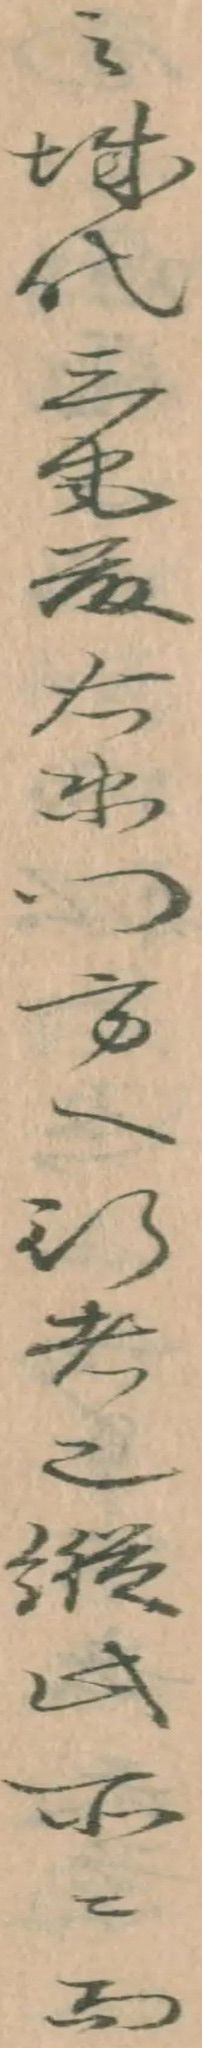之城代三宅藤右衛門方へ行者也縦此所に而
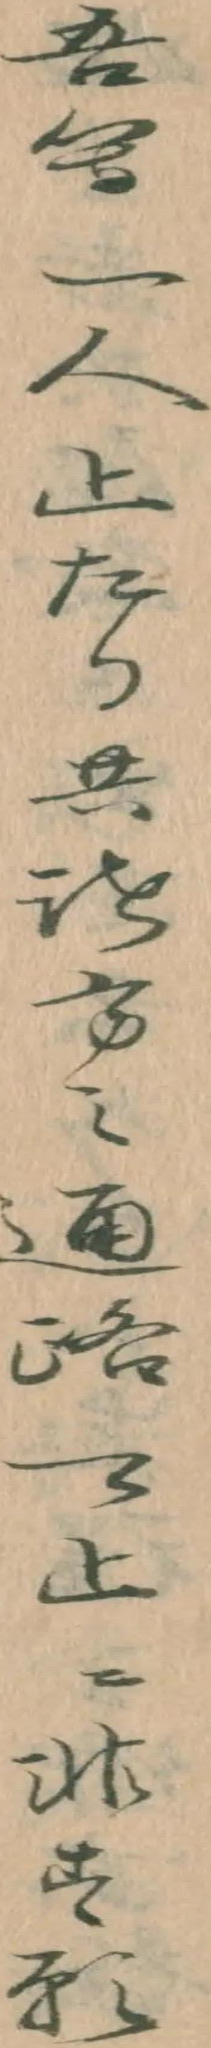吾等一人止たり共諸方之通路可止に非春願
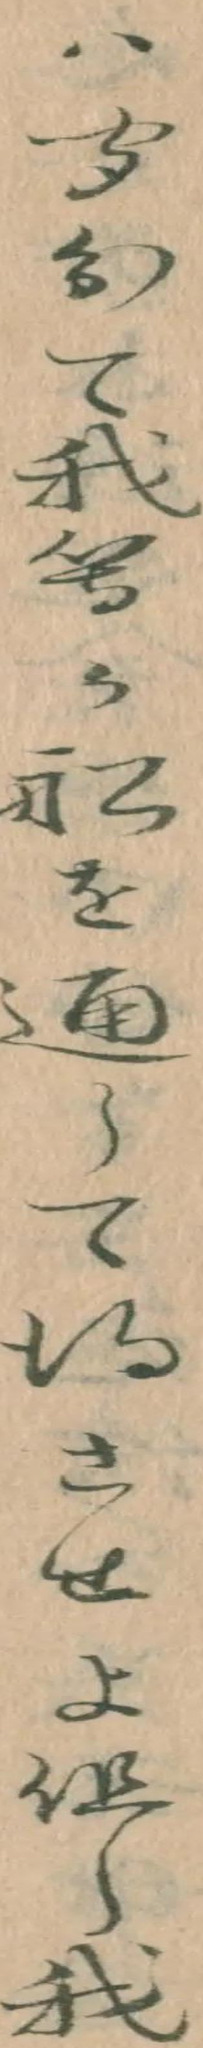は聞分て我等か舩を通して得させよ但し我
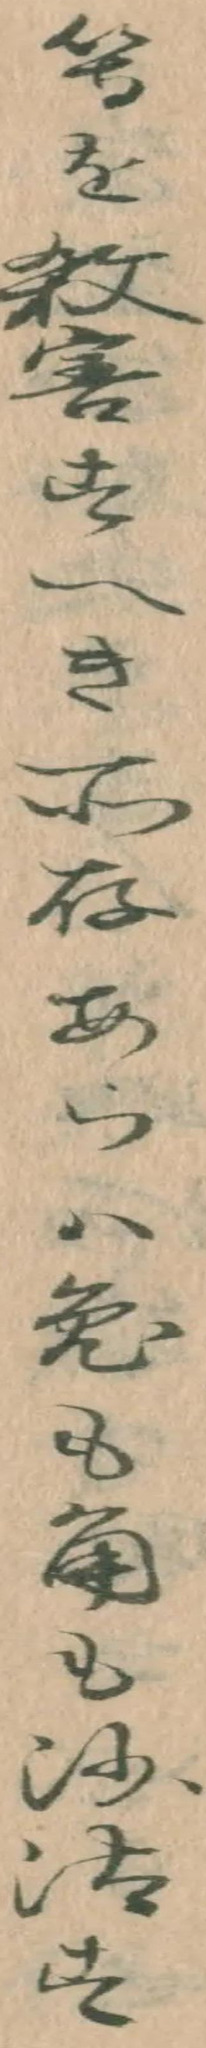等を殺害春へき所存あらは兎も角も沙汰春
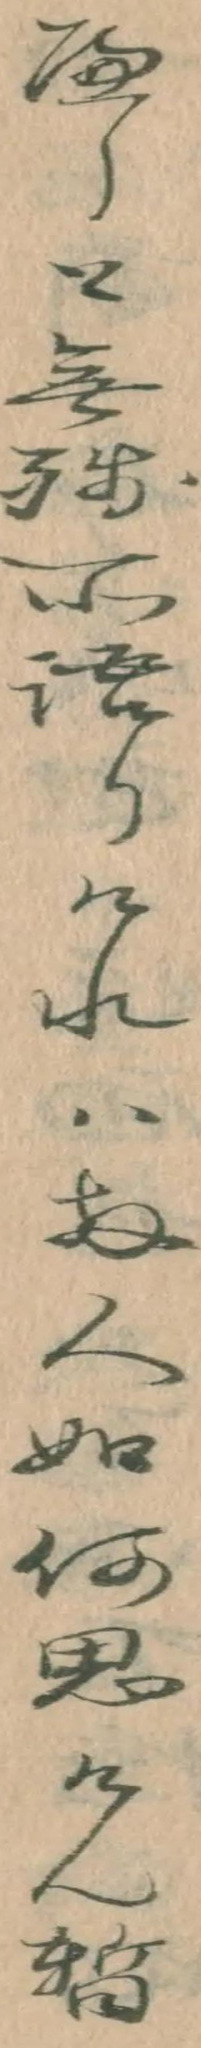扁しと無残所語りけれは両人如何思けん暫
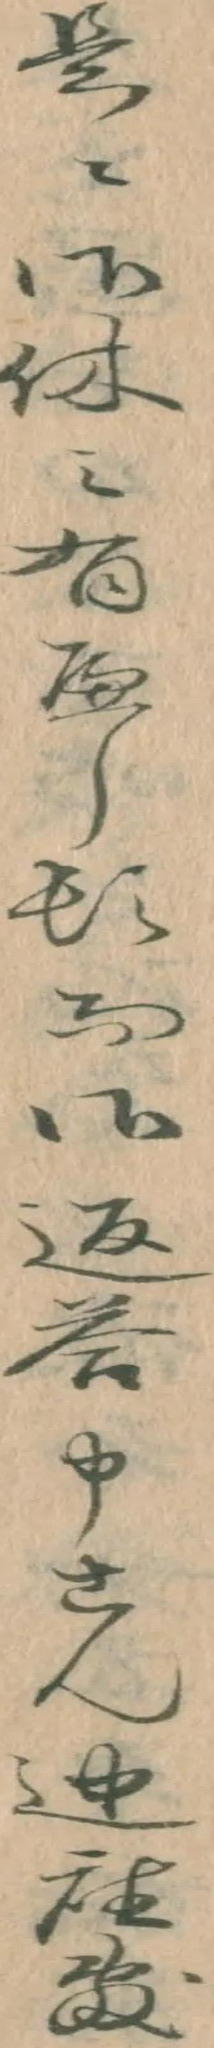是に御休之有扁し頓而御返答申さん迚座敷
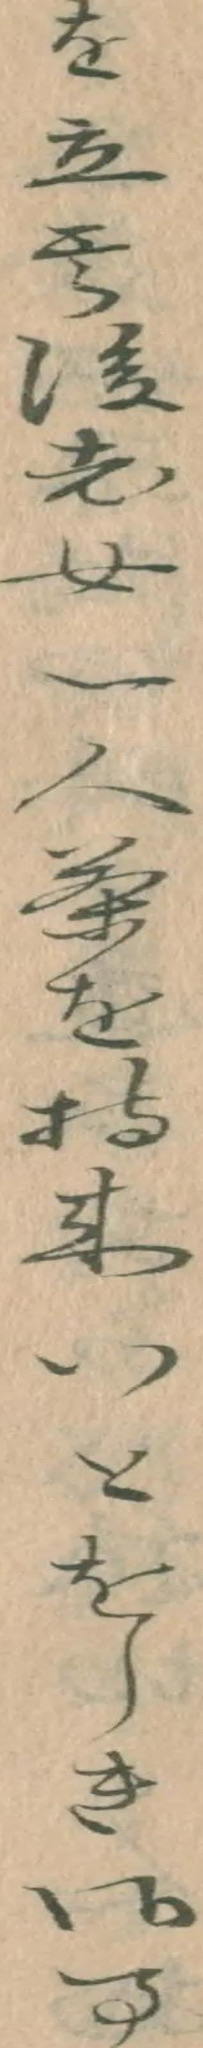を立其後老女一人茶を持参いとをしき御事
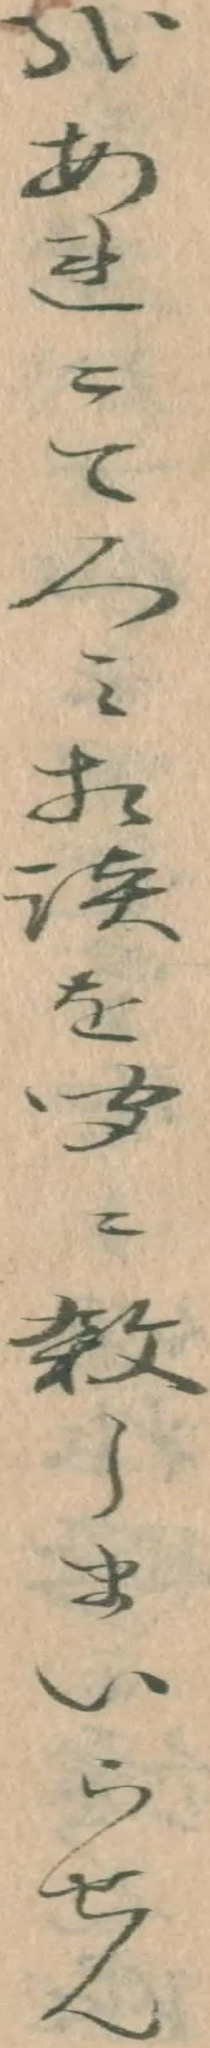哉あ連にて人之相談を聞に殺しまいらせん
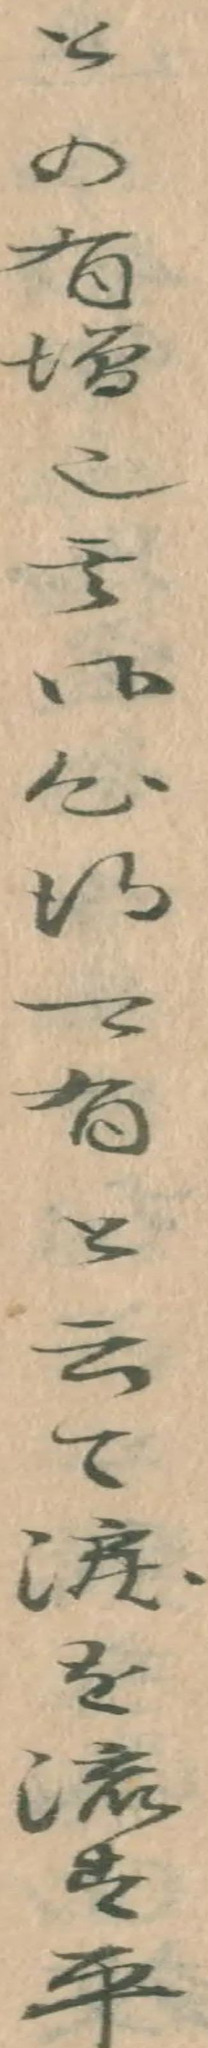との有増也其御心得可有と云て涙を流春平
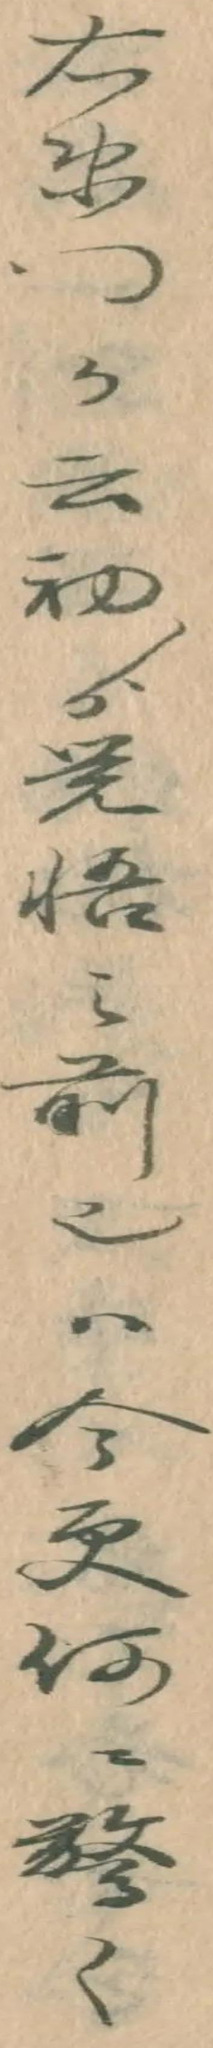右衛門か云初ゟ覚悟之前也は今更何に驚く

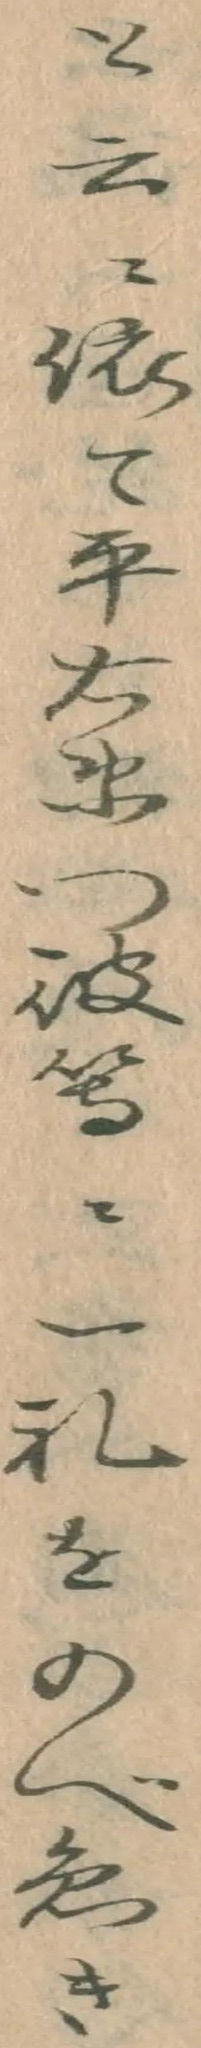と云に依て平右衛門彼等に一礼をのべ急き
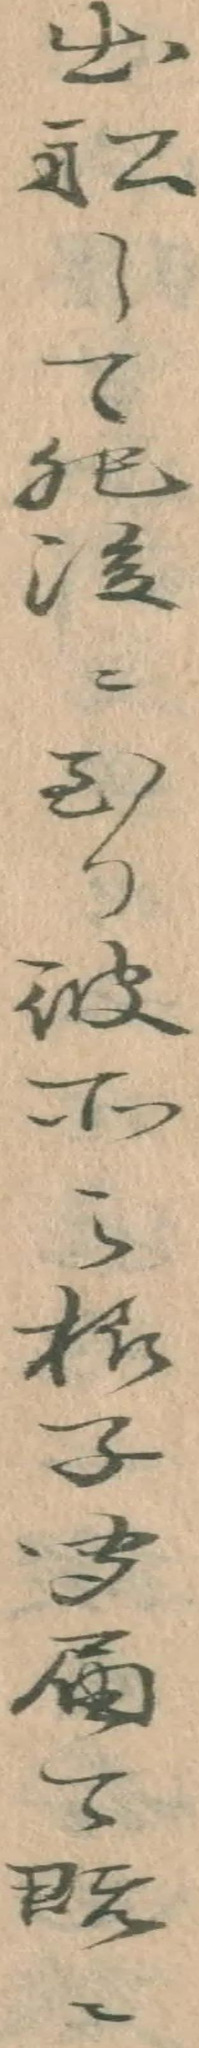出舩して肥後に至り彼所之様子聞届て既に
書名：切支丹御退治記 49巻. [2]
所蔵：国立国会図書館 National Diet Library, JAPAN
